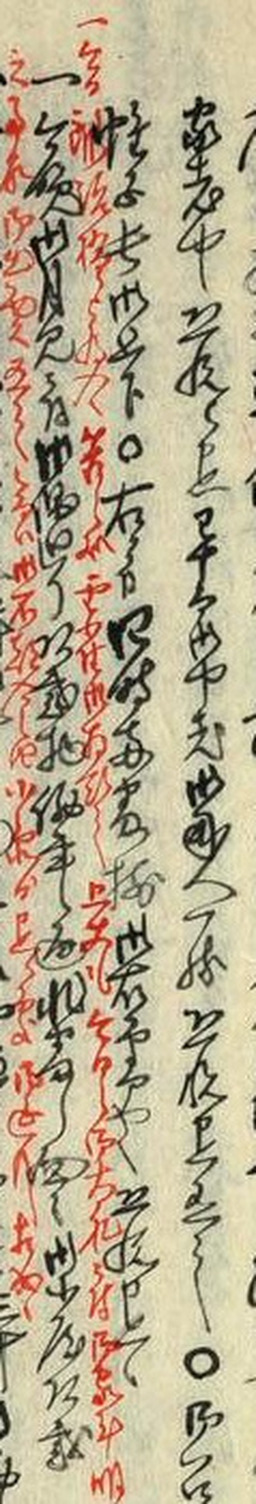帷子長御上下〇右ニ付四時両番揃御右筆部やへ恐悦申上候
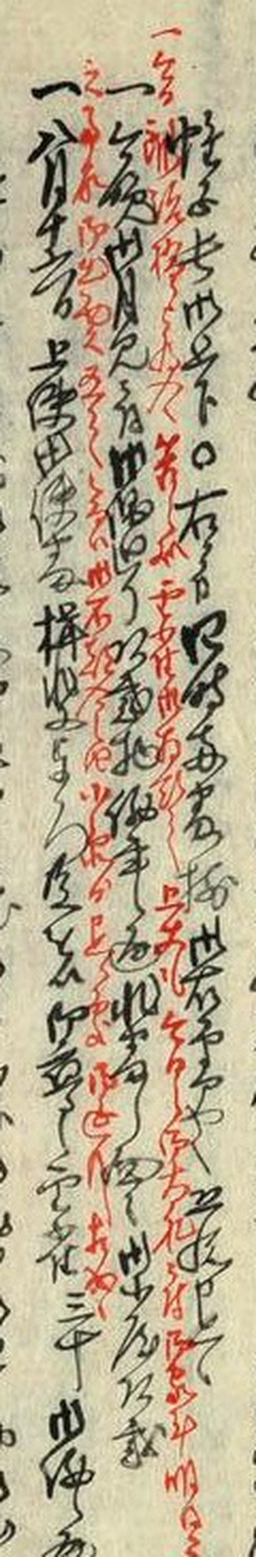一今晩御月見ニ付御側廻り頂戴物例年之通非番之面々御小屋頂戴
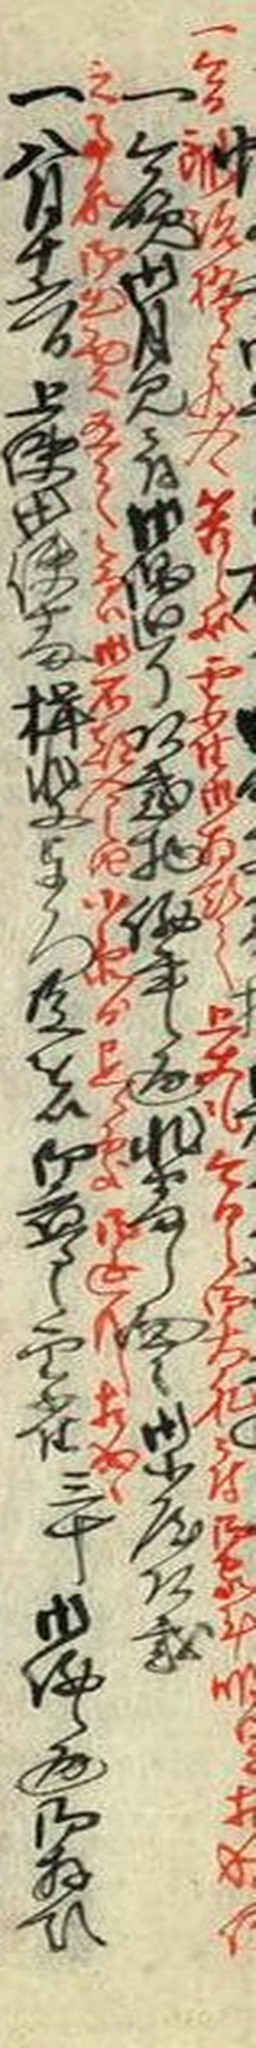一八月十六日上使御使番揖斐与右衛門殿を以御鷹之雲雀三十御例之通御拝領
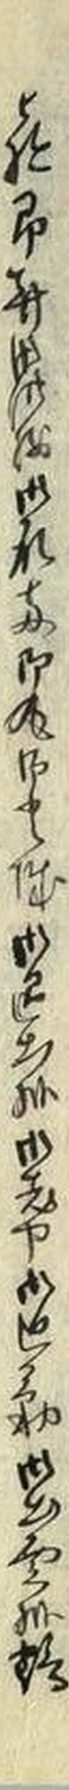被遊即刻御供揃御礼両御丸御登城御退出掛御老中御廻勤御出殿掛鶴
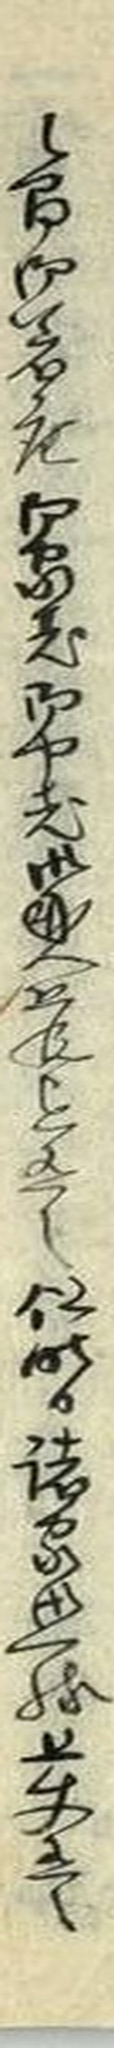之間御着座御家老御中老御用人恐悦申上有之但昨日諸家御一統上使有之
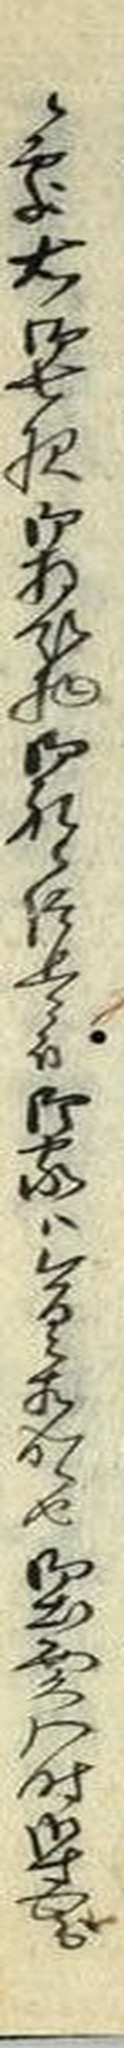候処右御七夜御拝領物御礼被仰上候ニ付御家ハ今日ニ相成候由御出殿八時弐寸五分
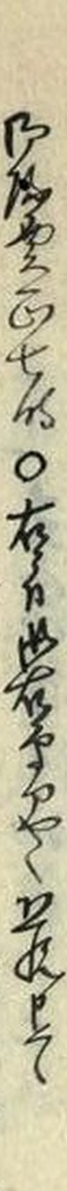御帰殿正七時〇右ニ付御右筆部やへ恐悦申上候
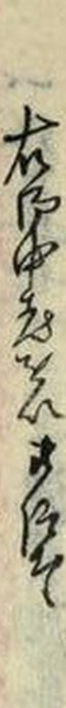右御中老を以被仰出候

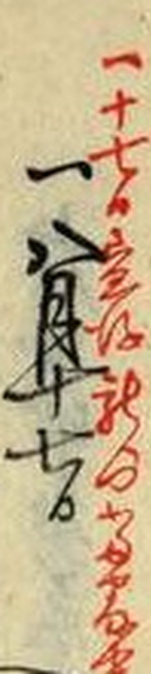一八月十七日
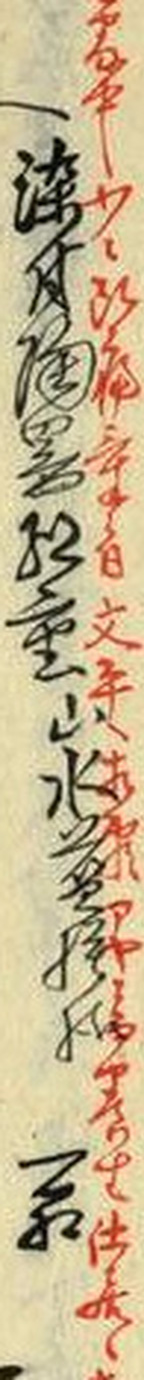漆付陶器組重山水菫模様一箱
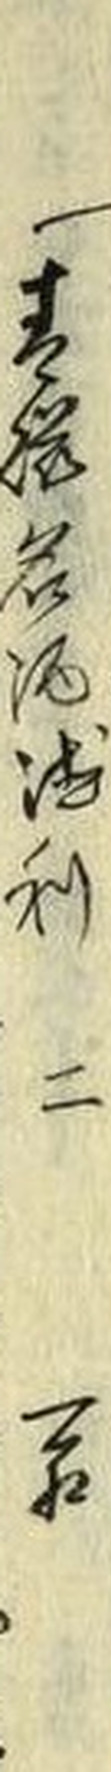青緑名酒徳利二一箱
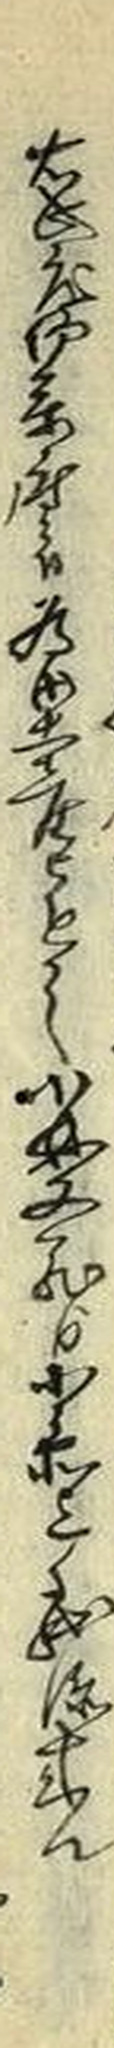右此度御参府ニ付為御土産被進之小林又蔵ゟ小兵衛迄手紙添来ㇽ
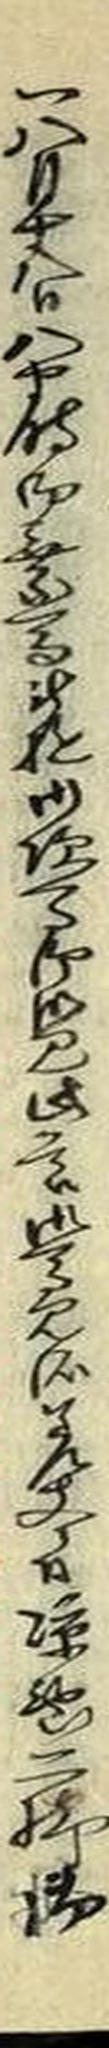一八月十八日八半時御乗馬被遊御次馬御覧此節御馬見所差支ニ付涼台二脚御
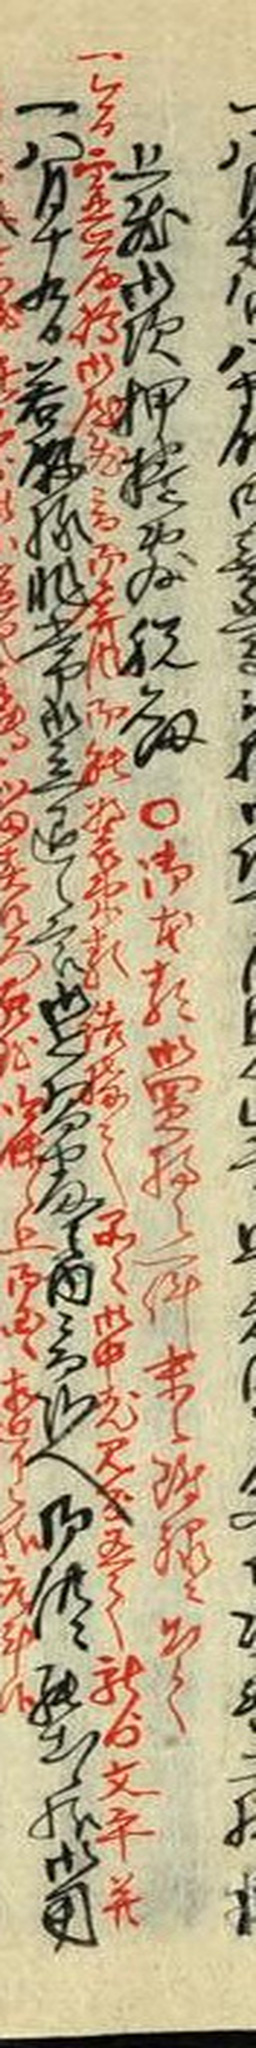一八月十九日若殿様非常御立通之節御近習番之内ニ而弐人御供ニ罷出候様御用
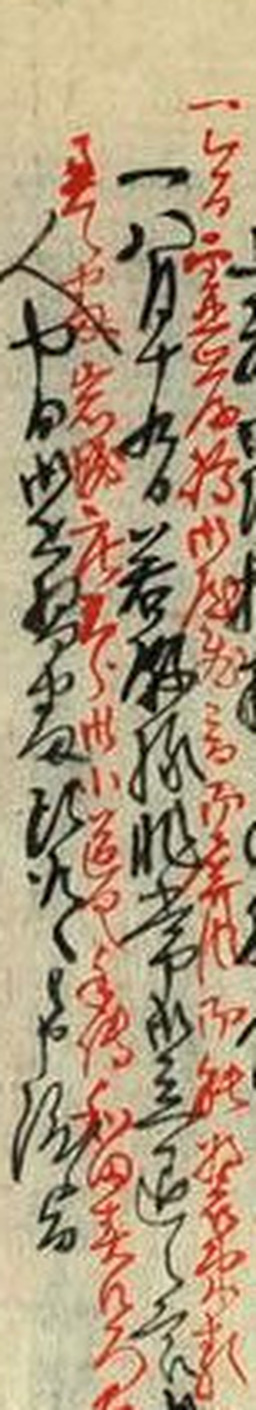人中ゟ御近習番頭取へ被申渡候旨
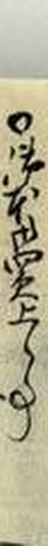〇御本御買上之事
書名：少傅日録抄（斉承付側向頭取日記、在府）
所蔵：福井県文書館 Fukui Prefectural Archives
